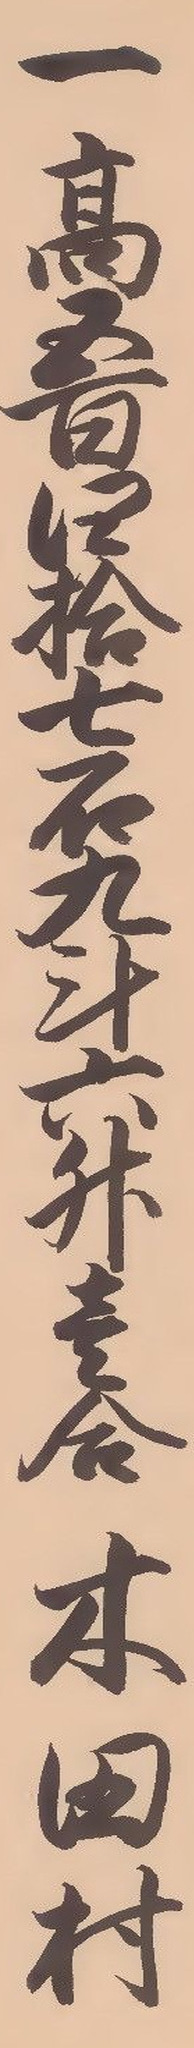一高五百四拾七石九斗六升壱合木田村
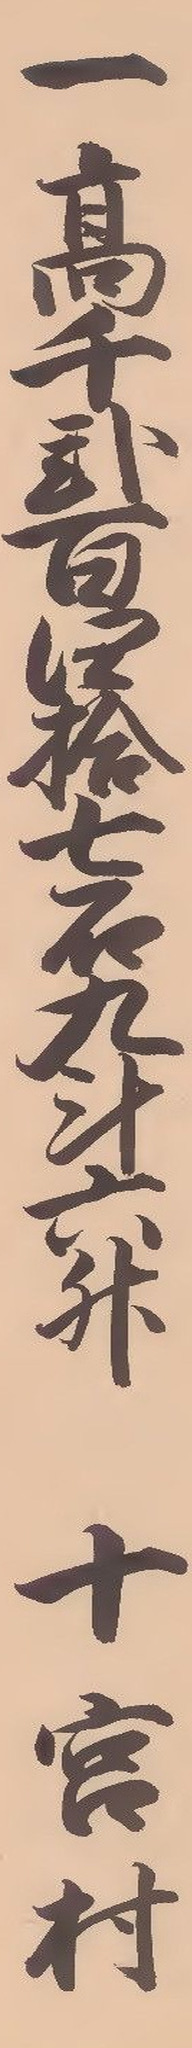一高千弐百四拾七石九斗六升十宮村
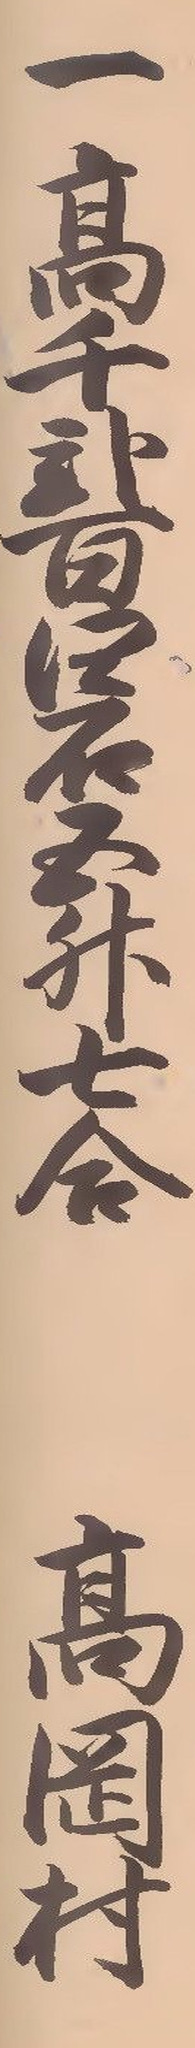一高千弐百四石五升七合高岡村
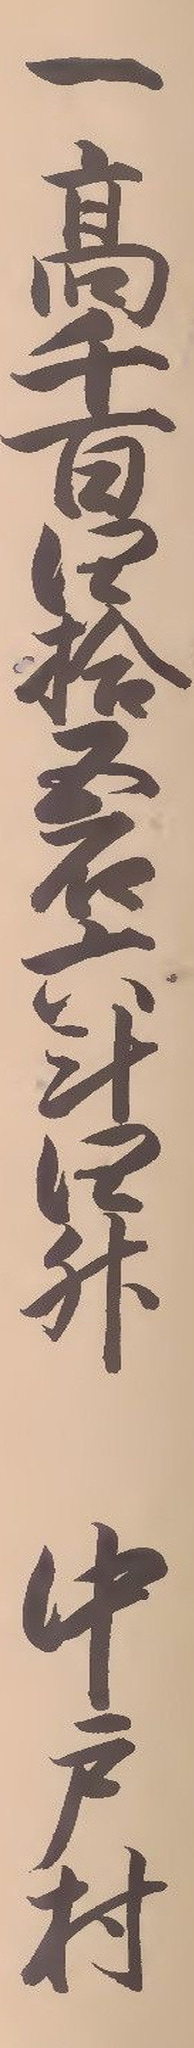一高千百四拾五石六斗四升中戸村
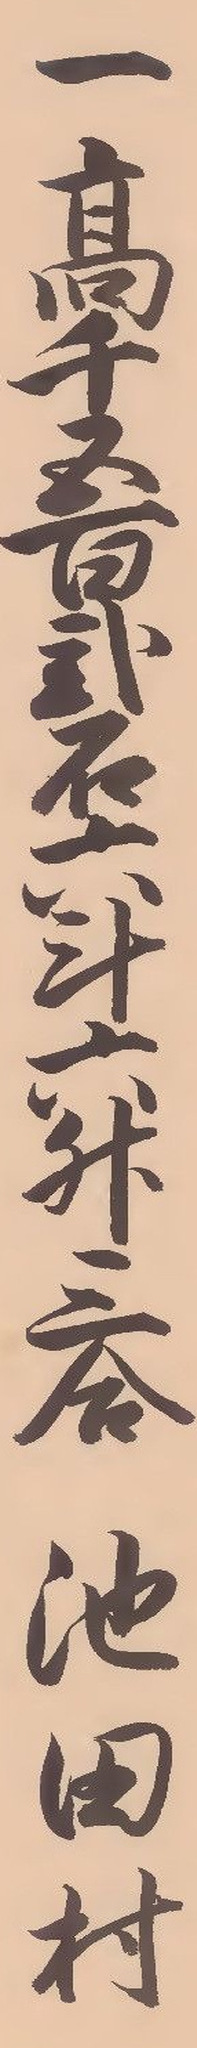一高千五百弐石六斗六升三合池田村
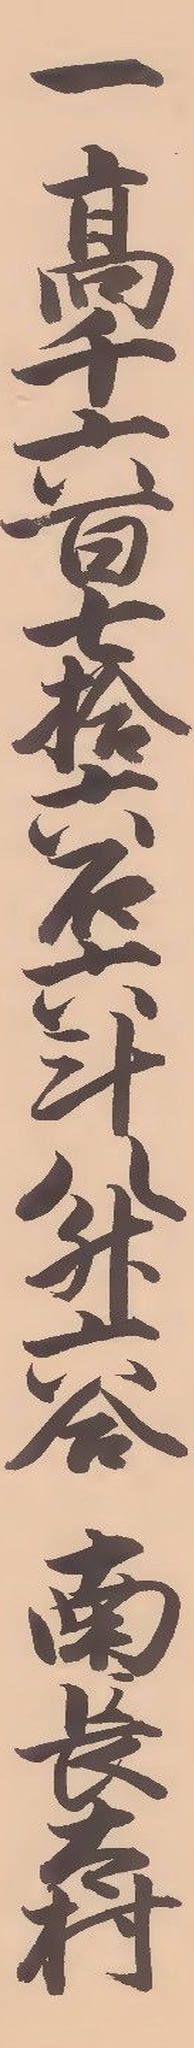一高千六百七拾六石六斗八升六合南長太村
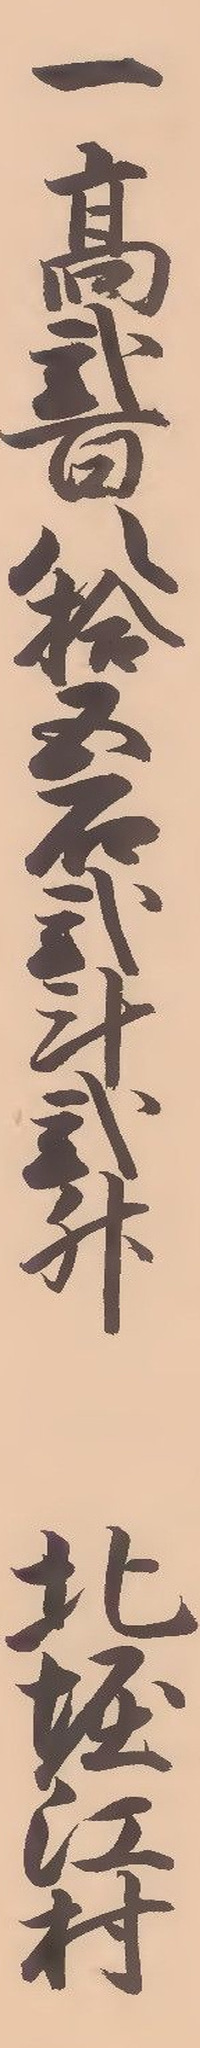一高弐百八拾五石弐斗弐升北堀江村

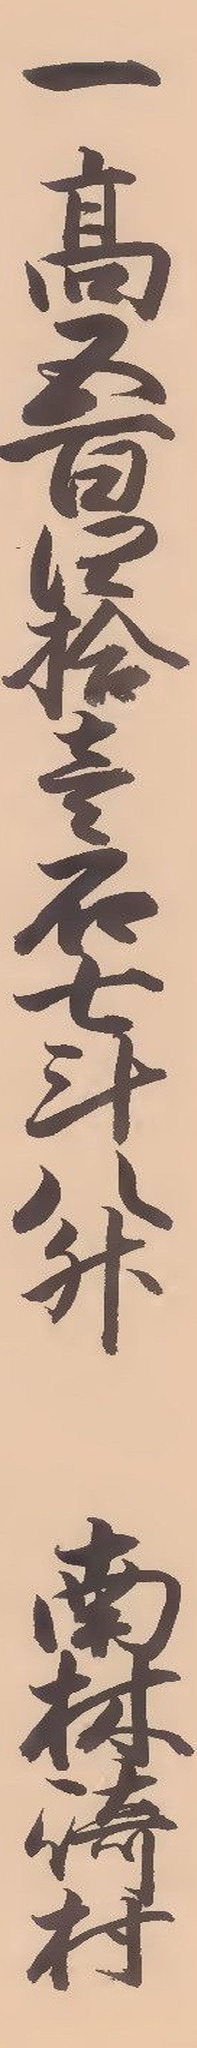一高五百四拾壱石七斗八升南林崎村
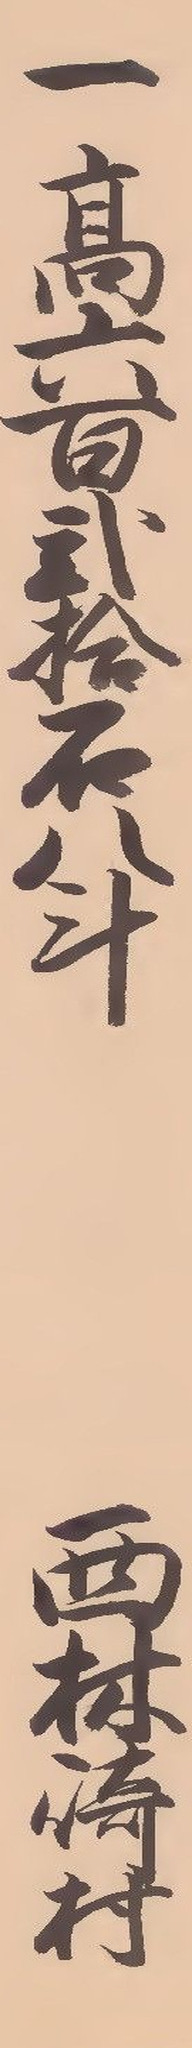一高六百弐拾石八斗西林崎村
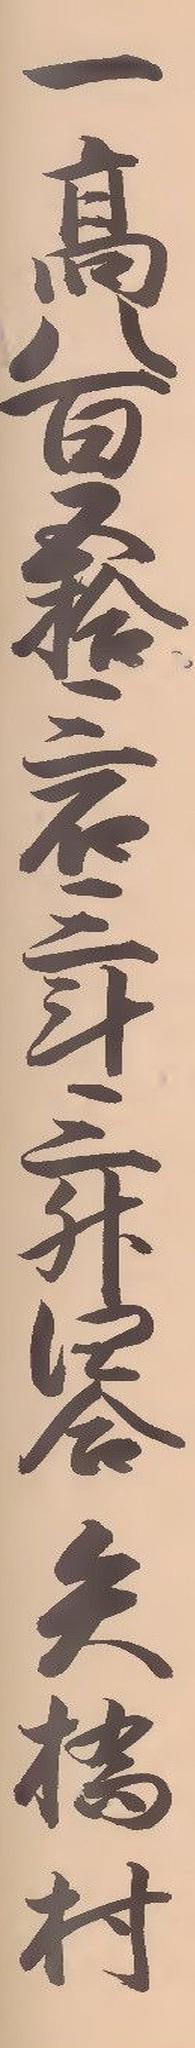一高八百五拾三石三斗三升四合矢橘村
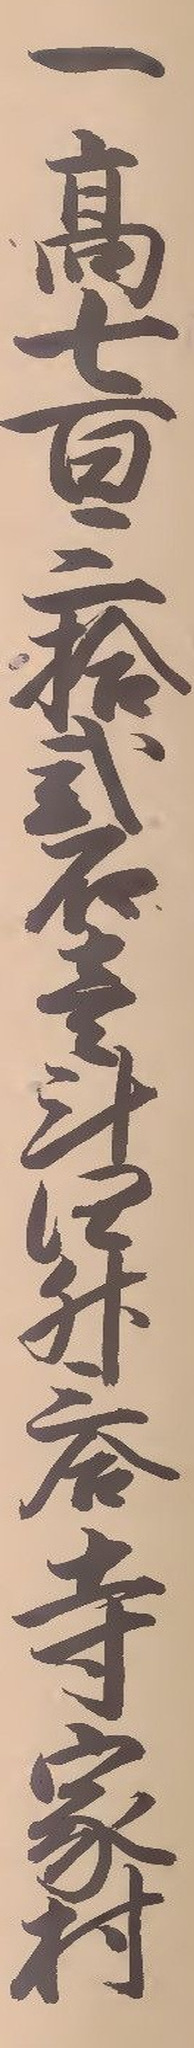一高七百三拾弐石壱斗四升三合寺家村
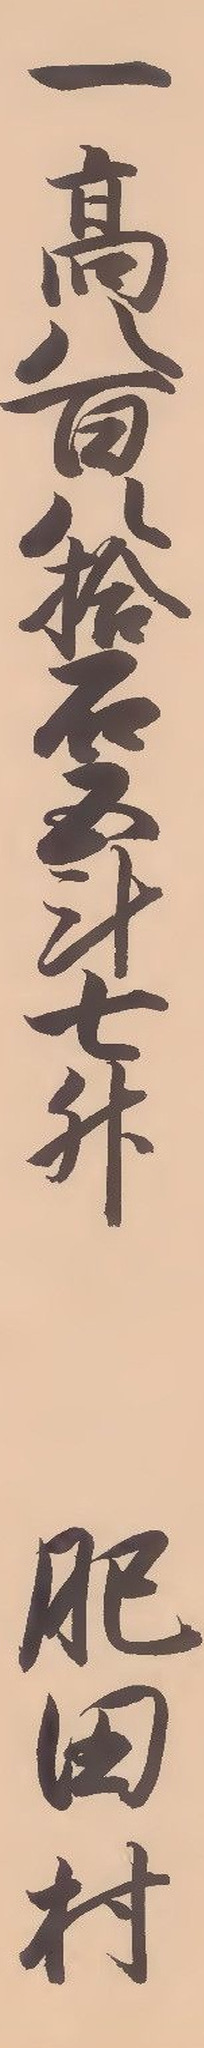一高八百八拾石五斗七升肥田村
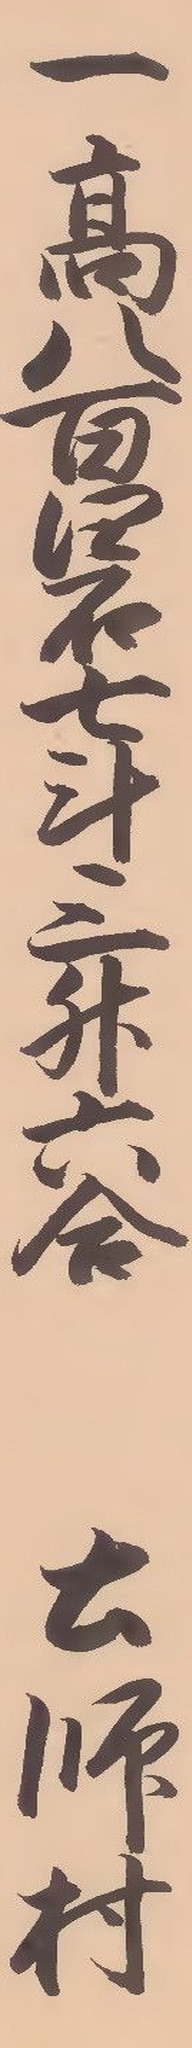一高八百四石七斗三升六合土師村
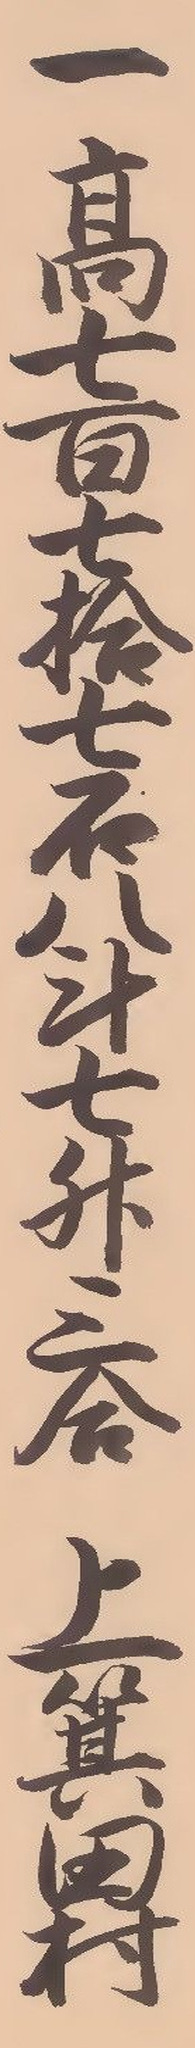一高七百七拾七石八斗七升三合上箕田村

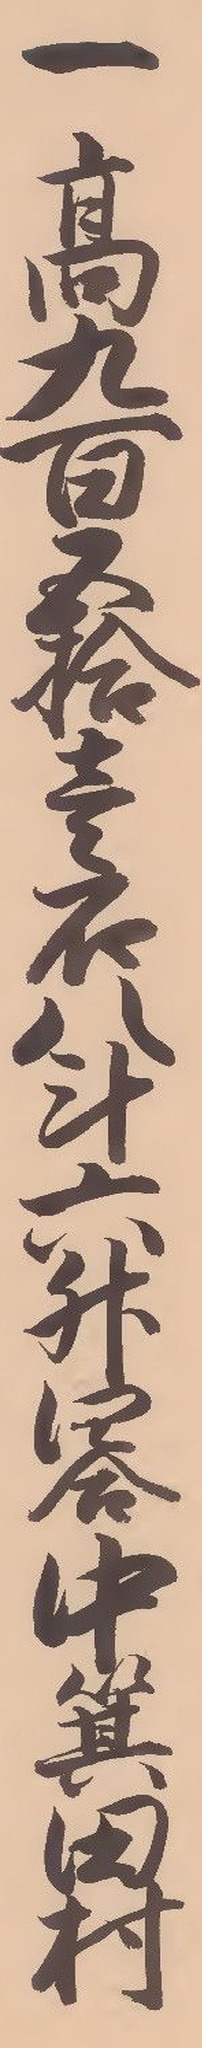一高九百五拾壱石八斗六升四合中箕田村
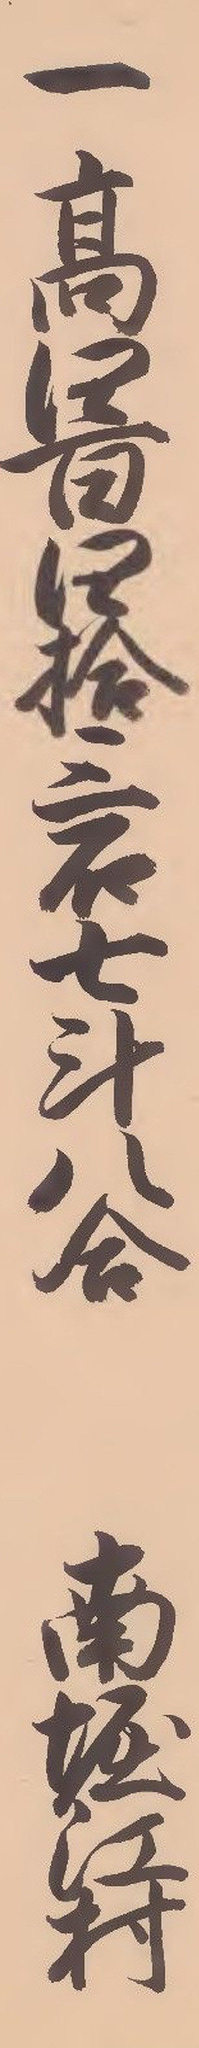一高四百四拾三石七斗八合南堀江村
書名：伊勢国郷帳
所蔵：国立公文書館 National Archives of Japan
